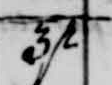32
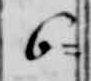6
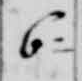6
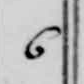6
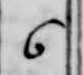6
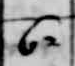6
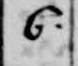6
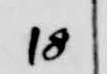18
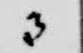3
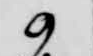9
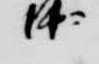14
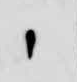1
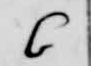6
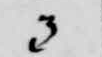3
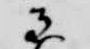3
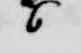6
